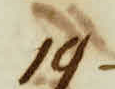19
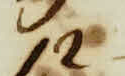12
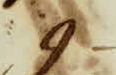9
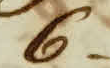6
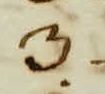3
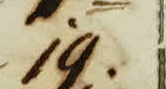19
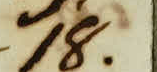18
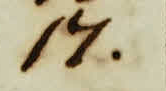17.
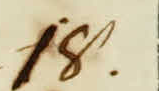18.
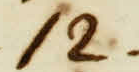12
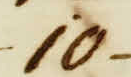10
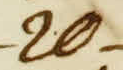20
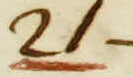21
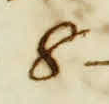8
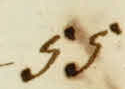55
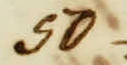50
